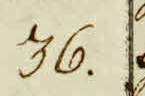36.
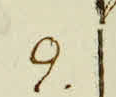9.
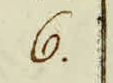6.
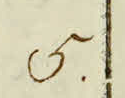5.
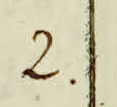2.
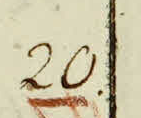20.
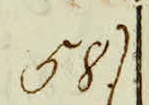58.
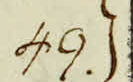49.
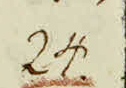24.
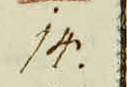14.
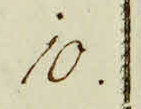10.
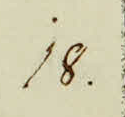18.
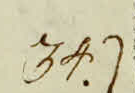34.
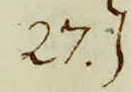27.
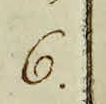6.
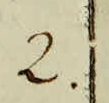2.
